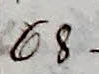68
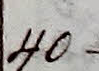40
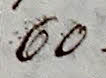60
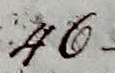46
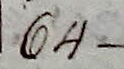64
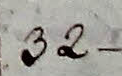32
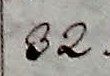32
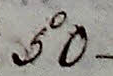50
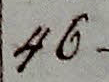46
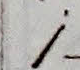1
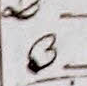3
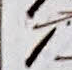1
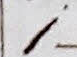1
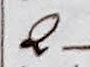2
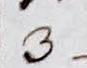3
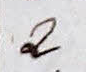2
